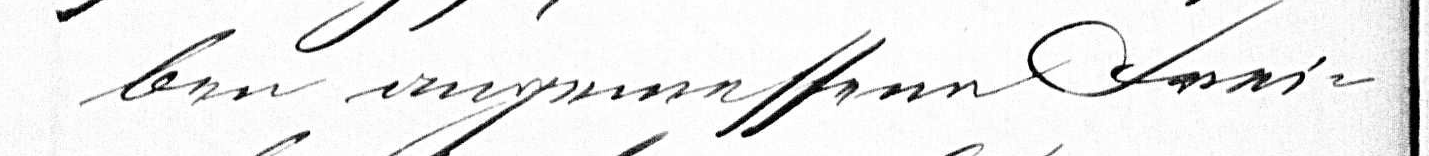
ben angemessene Frei¬
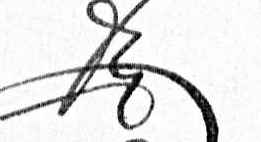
xx
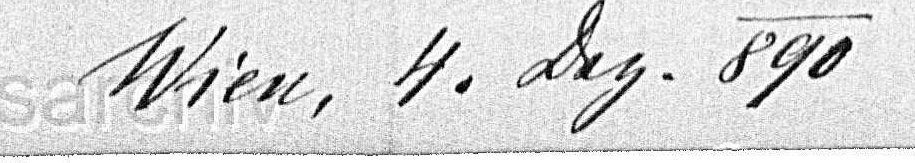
Wien, 4. Dez. 890
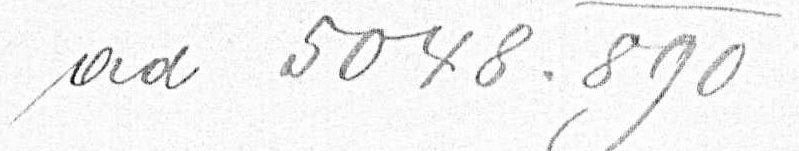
ad 5048. 890
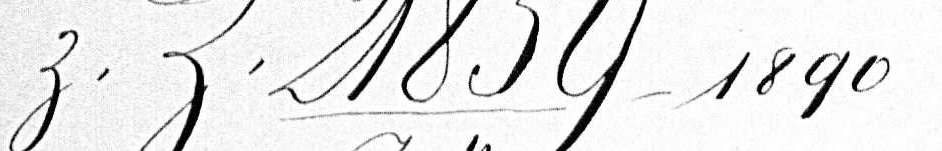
z. Z. 21859- 1890
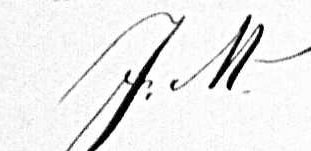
J. M.
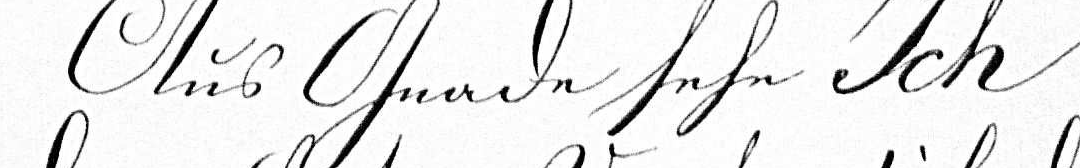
Aus Gnade sehe Jch
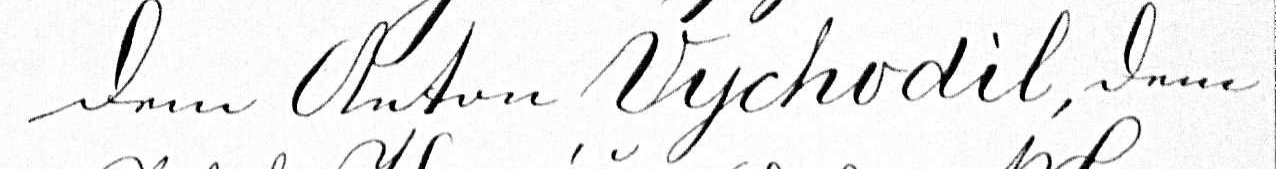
dem Anton Vychodil, dem
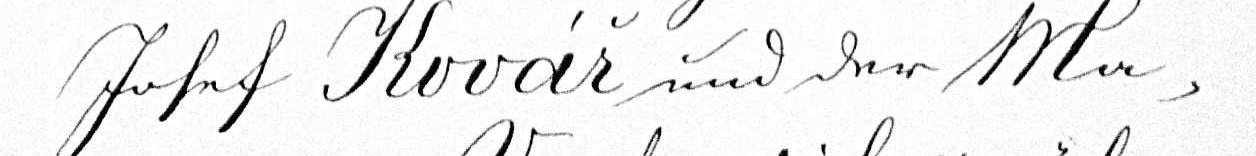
Josef Kovár und der Ma¬
